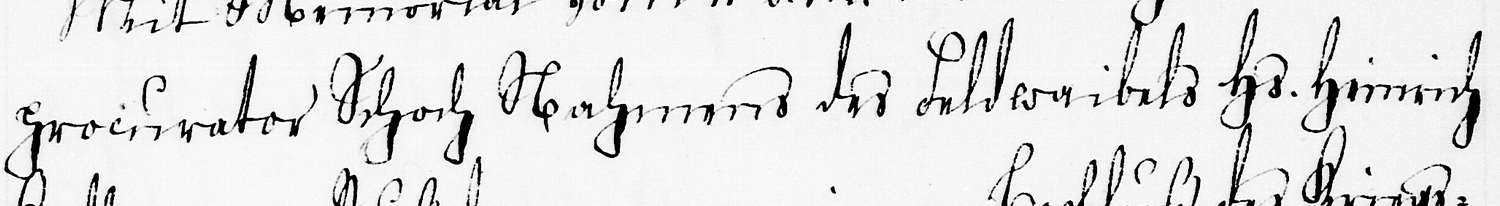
rocurator Schoch Nahmens des Feldwaibels Hs. Heinrich
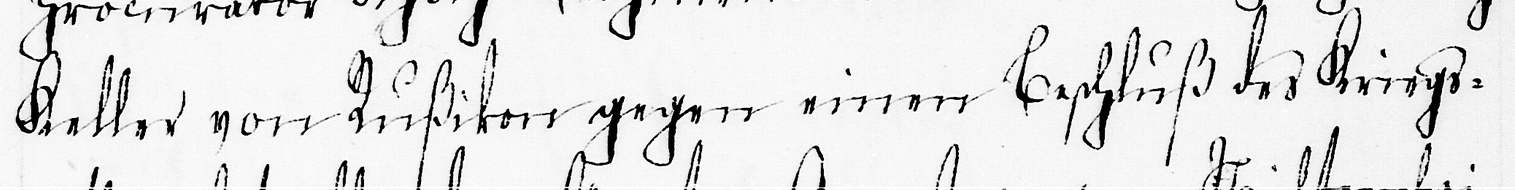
Keller von Rußikon gegen einen Beschluß des Kriegs¬
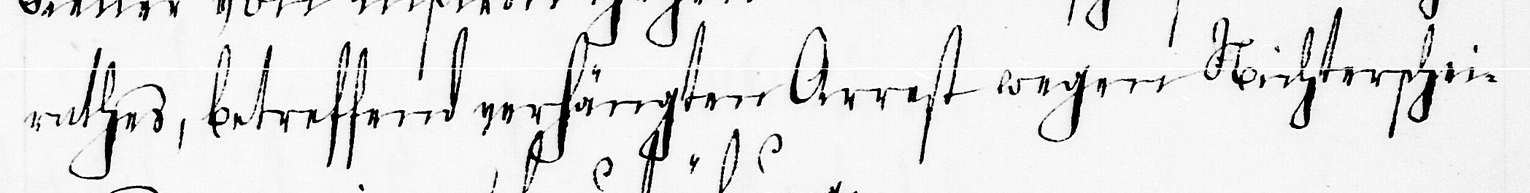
rathes, betreffend verhängten Arrest wegen Nichterschei¬
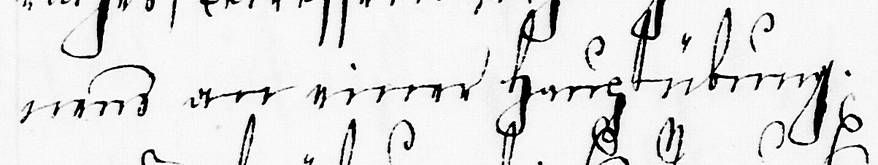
nens an einer Hauptübung.
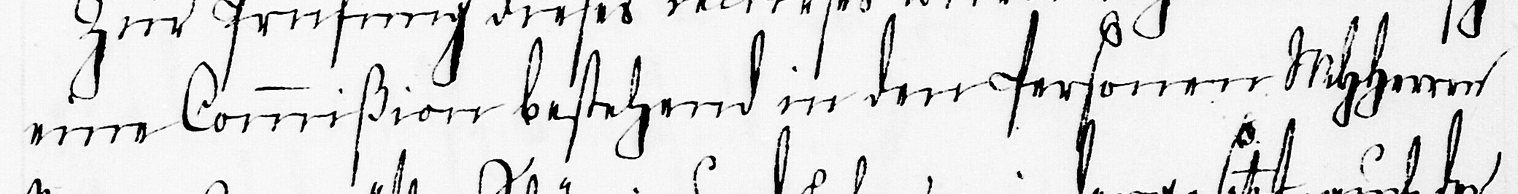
eine Commißion bestehend in den Personen MHHerren
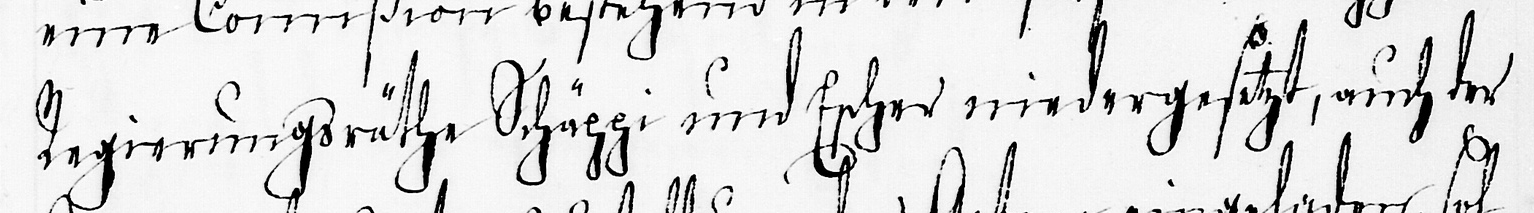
Regierungsräthe Schäppi und Escher niedergesetzt, auch der
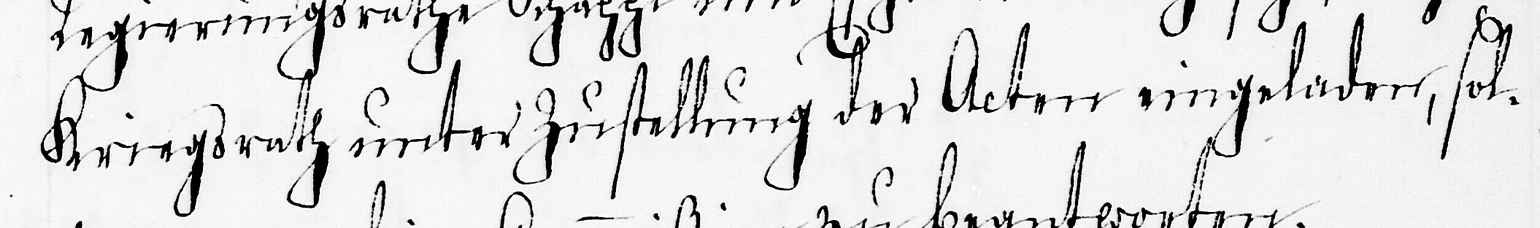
Kriegsrath unter Zustellung der Acten eingeladen, sol¬
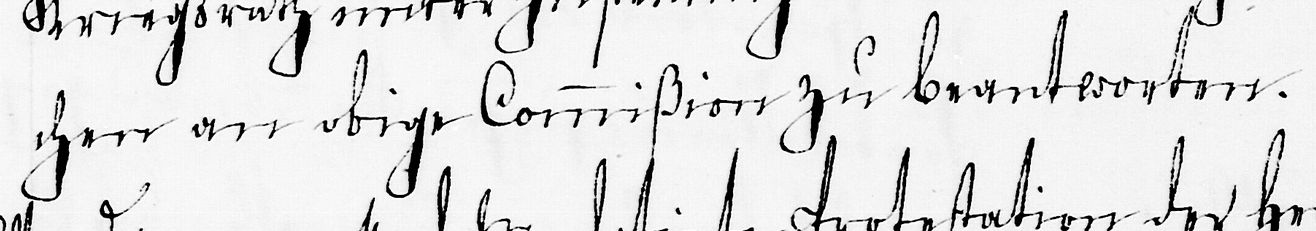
chen an obige Commißion zu beantworten.
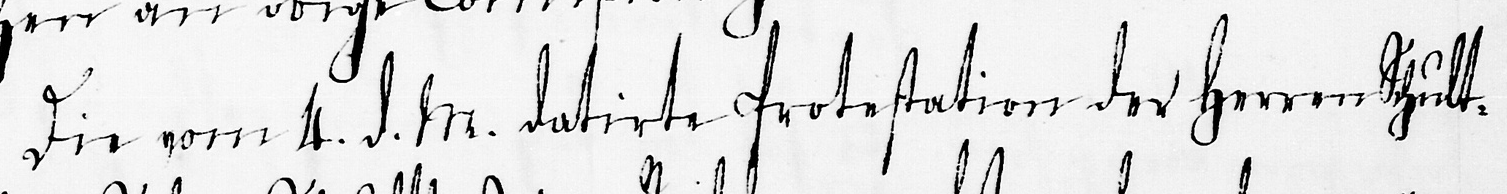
Die vom 4. d. M. datirte Protestation der Herren Schul¬
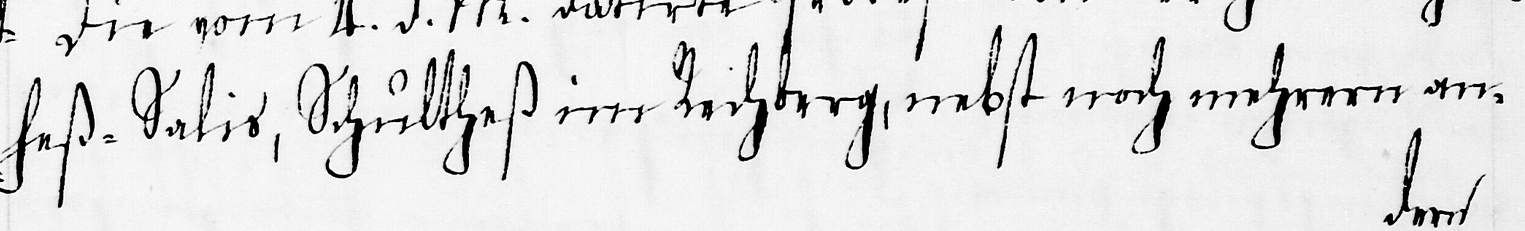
heß-Salis, Schultheß im Rechberg, nebst noch mehrern an-
